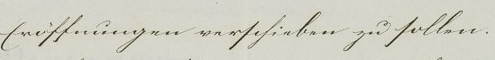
Eröffnungen verschieben zu sollen.
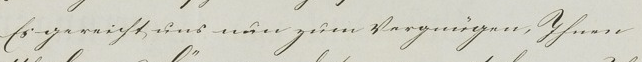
Es gereicht uns nun zum Vergnügen, Ihnen
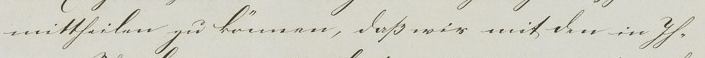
mittheilen zu können, daß wir mit den in Ih-
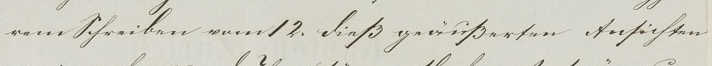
rem Schreiben vom 12. dieß geäußerten Ansichten
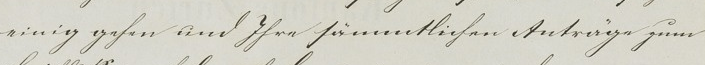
einig gehen und Ihre sämmtlichen Anträge zum
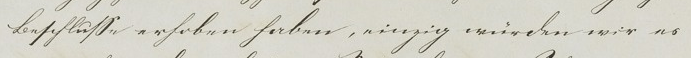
Beschlusse erhoben haben, einzig würden wir es
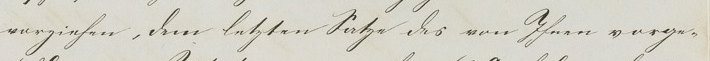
vorziehen, dem letzten Satze des von Ihnen vorge-
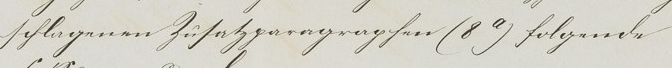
schlagenen Zusatzparagraphen (8a) folgende
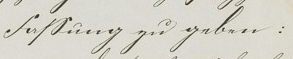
Fassung zu geben:
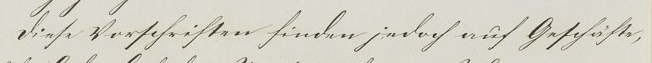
«Diese Vorschriften finden jedoch auf Geschäfte,
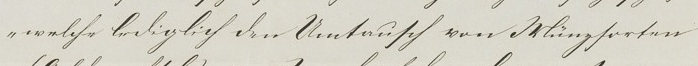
welche lediglich den Umtausch von Münzsorten
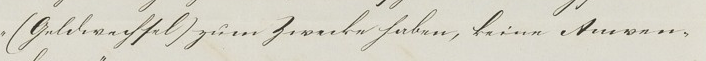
(Geldwechsel) zum Zwecke haben, keine Anwen-
